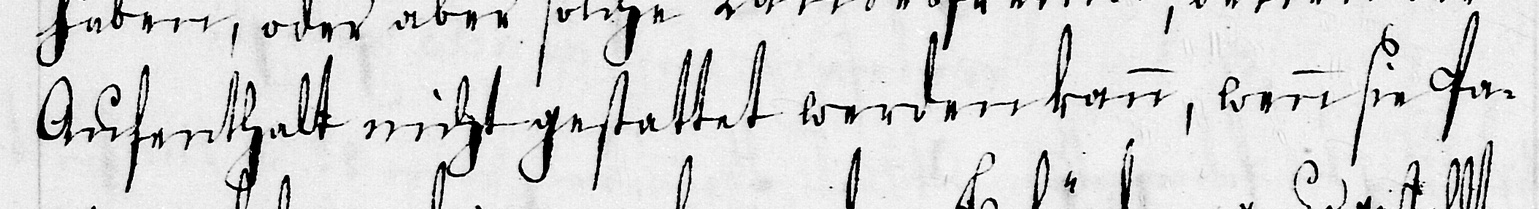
Aufenthalt nicht gestattet werden kann, wenn sie Pa¬
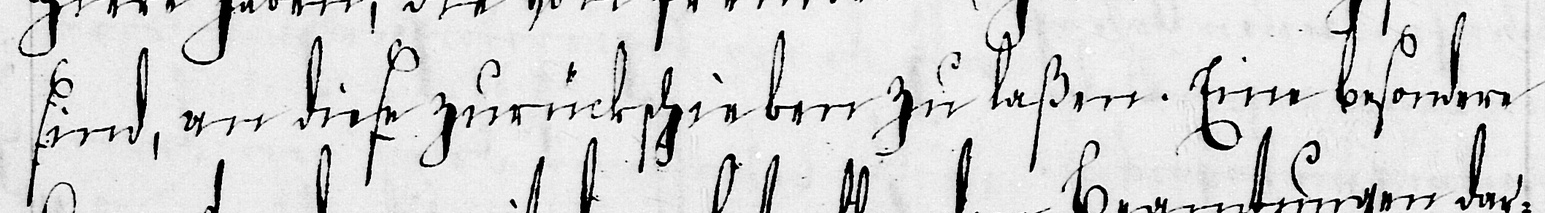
sind, an diese zurückschieben zu laßen. Eine besondere
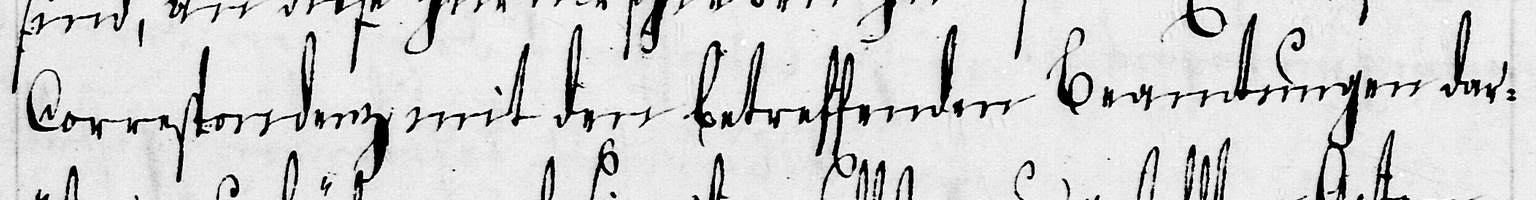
Correspondenz mit den betreffenden Beamtungen dar¬
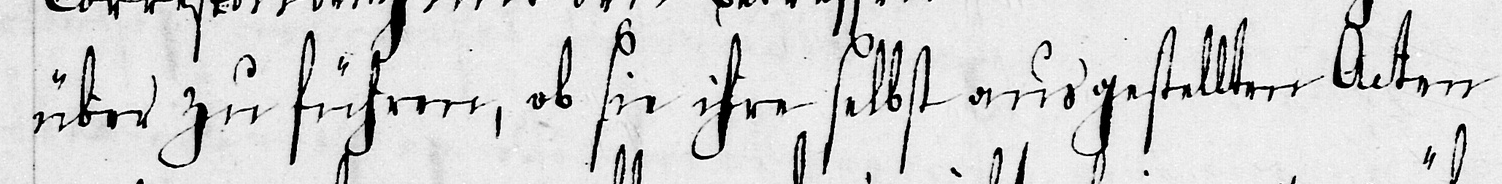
über zu führen, ob sie ihre selbst ausgestellten Acten
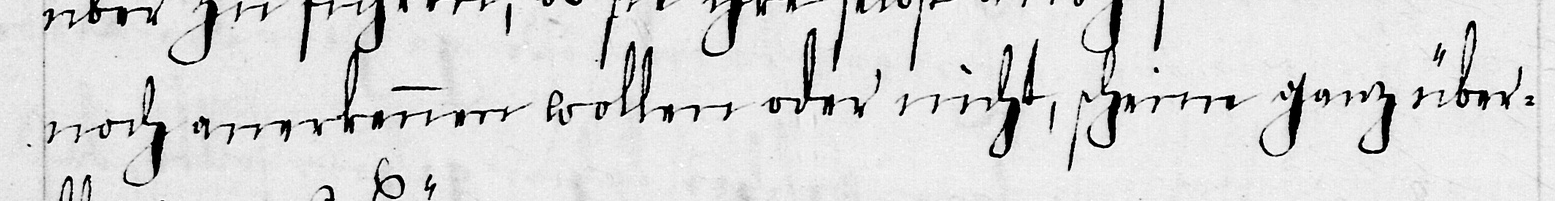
noch anerkennen wollen oder nicht, scheine ganz über¬
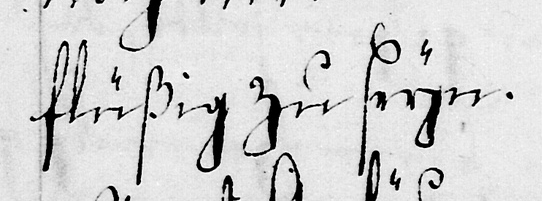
flüßig zu seyn.
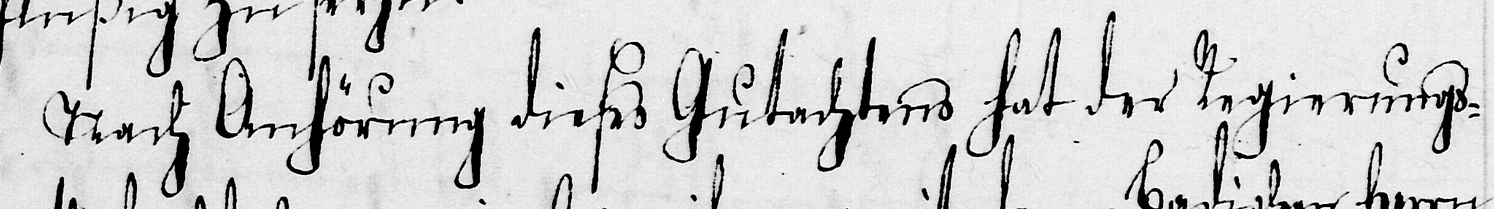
Nach Anhörung dieses Gutachtens hat der Regierungs¬
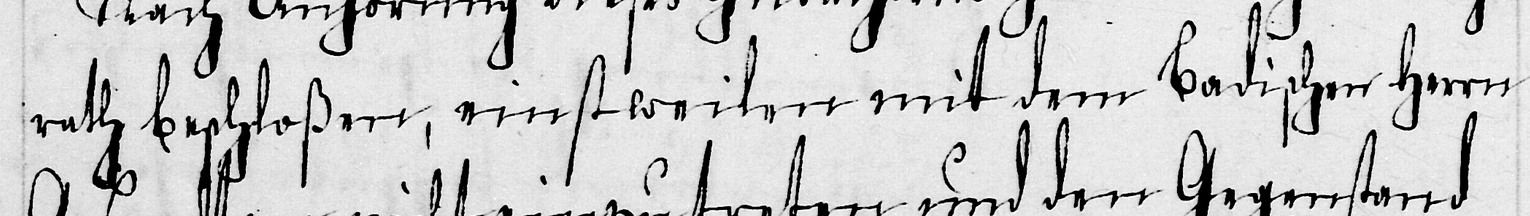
rath beschloßen, einstweilen mit dem Badischen Herrn
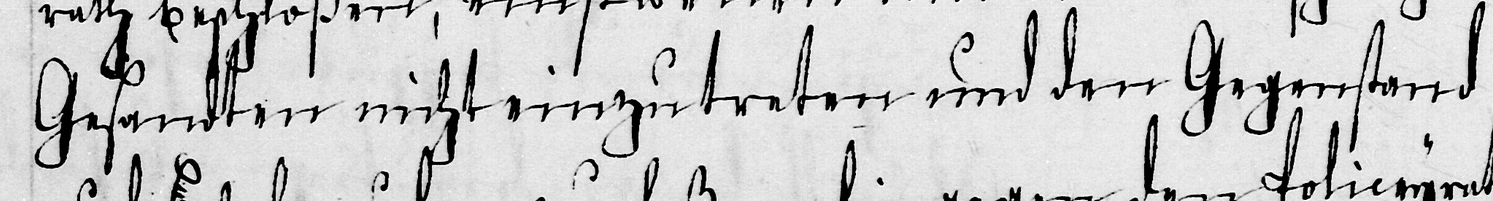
Gesandten nicht einzutreten und den Gegenstand
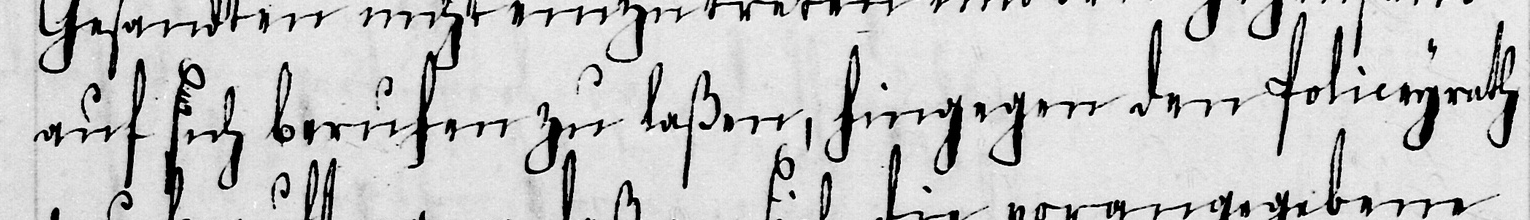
auf sich beruhen zu laßen, hingegen den Policeyrath
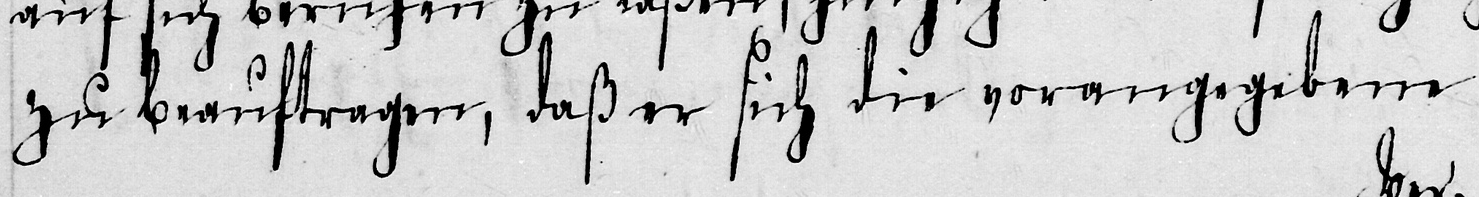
zu beauftragen, daß er sich die vorangegebene
